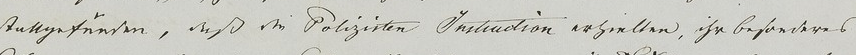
stattgefunden, daß die Polizisten Instruction erhielten, ihr besonderes
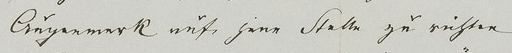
Augenmerk auf jene Stelle zu richten –
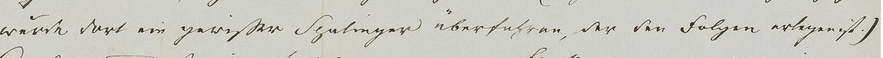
wurde dort ein gewißer Spalinger überfahren, der den Folgen erlegen ist.)
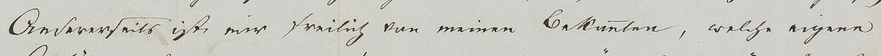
Andererseits ist mir freilich von meinen Bekannten, welche eigene
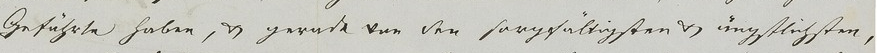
Gefährte haben, & gerade von den sorgfältigsten & ängstlichsten,
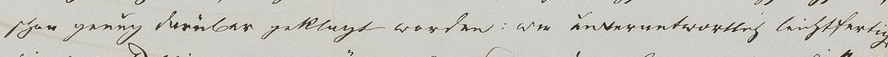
schon genug darüber geklagt worden: wie unverantwortlich leichtfertig
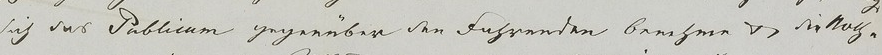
sich das Publicum gegenüber den Fahrenden benehme & die Noth-
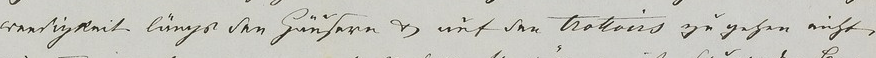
wendigkeit längs den Häusern & auf den Trottoirs zu gehen nicht
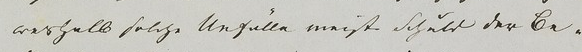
weshalb solche Unfälle meist Schuld der Be-
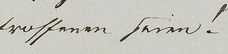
troffenen seien!
